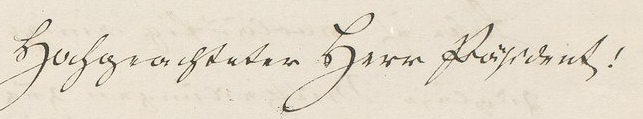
Hochgeachteter Herr Präsident!
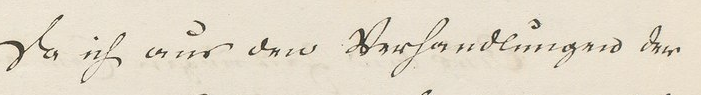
Da ich aus den Verhandlungen der
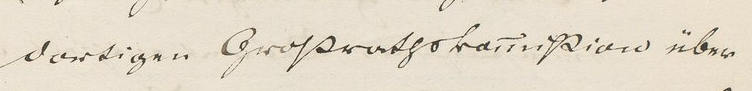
dortigen Großrathskommißion über
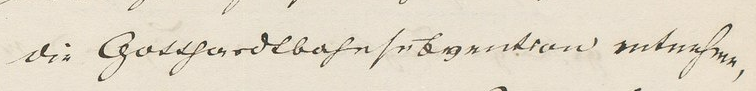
die Gotthardtbahnsubvention entnehme,
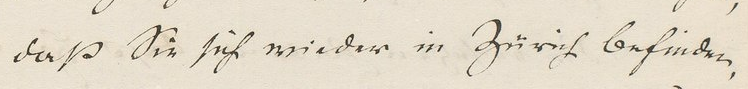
daß Sie sich wieder in Zürich befinden,
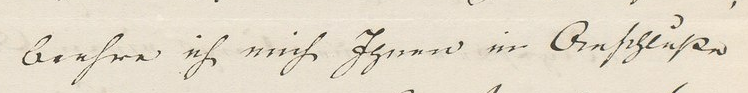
beehre ich mich Ihnen im Anschluße
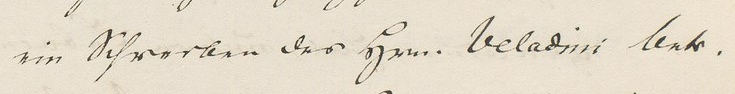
ein Schreiben des Hrn. Veladini betr.
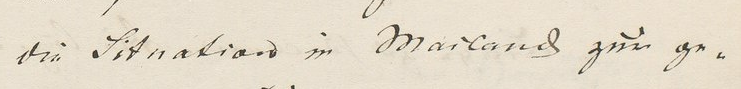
die Situation in Mailand zur ge-
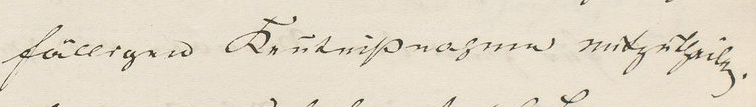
fälligen Kenntnißnahme mitzutheilen.
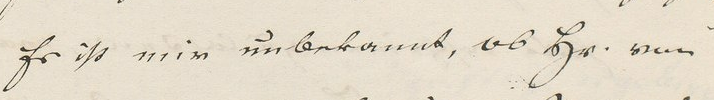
Es ist mir unbekannt, ob Hr. von
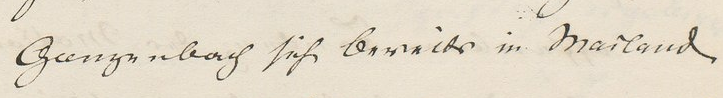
Gonzenbach sich bereits in Mailand
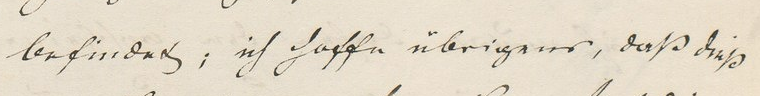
befindet; ich hoffe übrigens, daß dieß
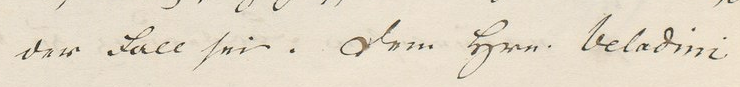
der Fall sei. Dem Hrn. Veladini
